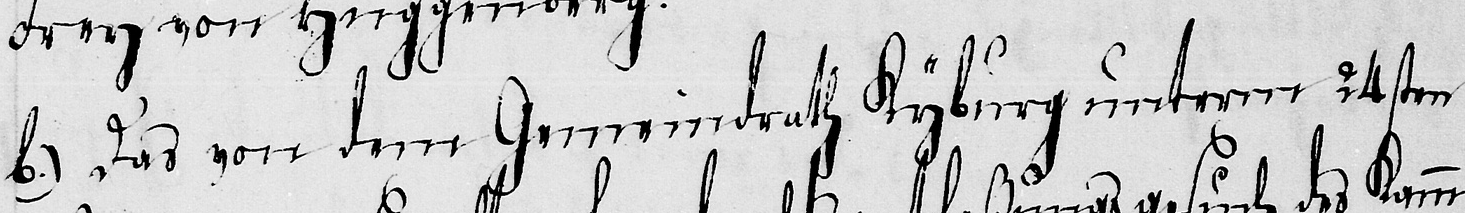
b.) Das von dem Gemeindrath Kyburg unterm 24sten
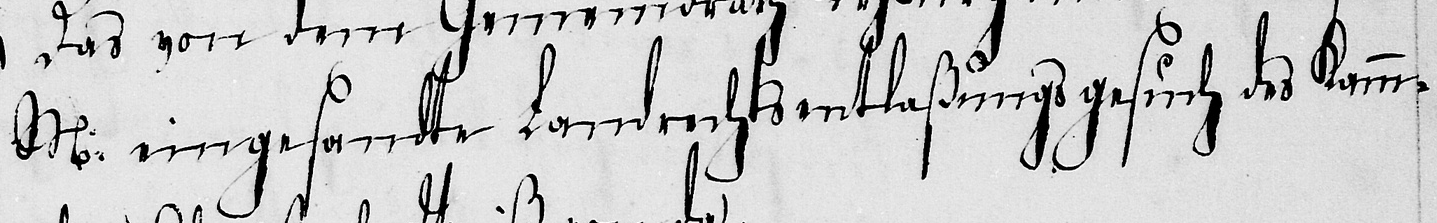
M. eingesandte Landrechtsentlaßungsgesuch des Kamm¬
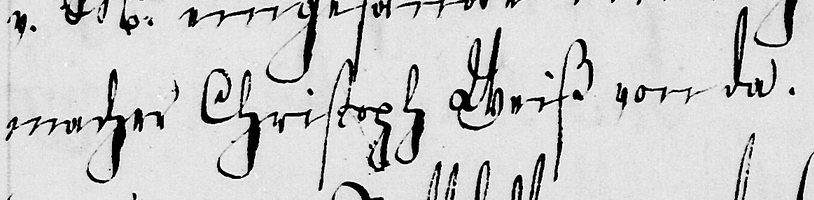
macher Christoph Weiß von da.
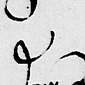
d.
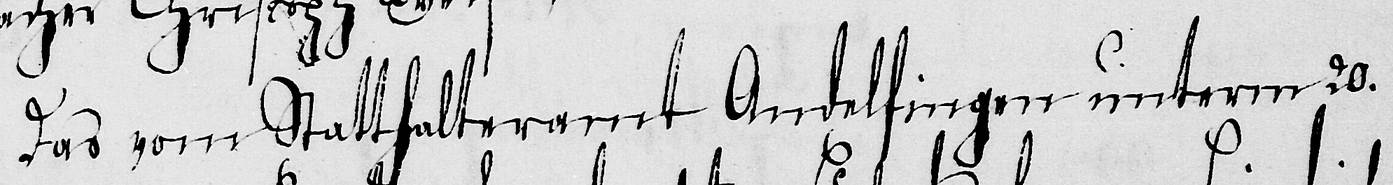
Das vom Statthalteramt Andelfingen unterm 20.
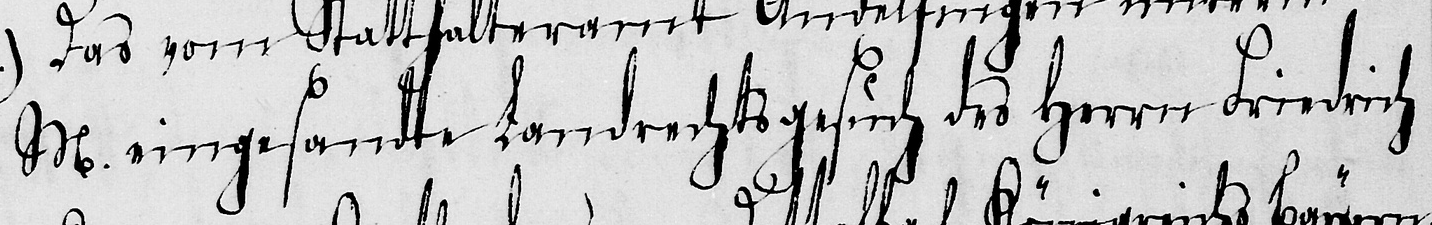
M. eingesandte Landrechtsgesuch des Herrn Friedrich
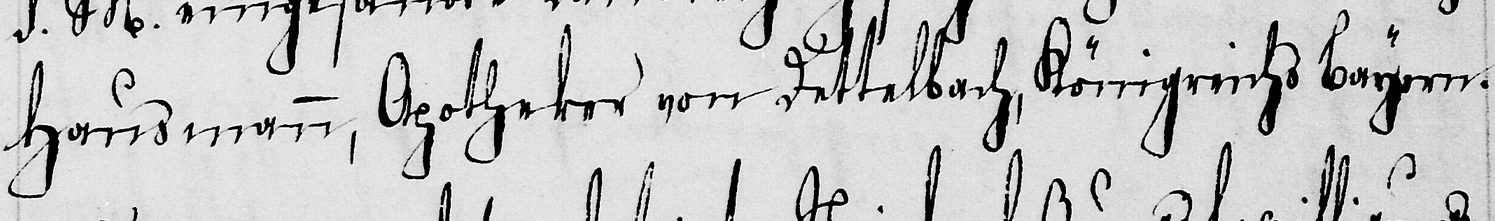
Hausmann, Apotheker von Dettelbach, Königreich Bayern.
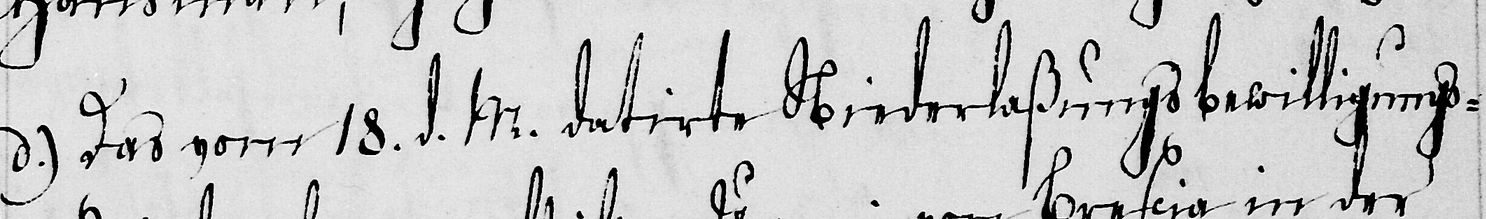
d.) Das vom 18. d. M. datirte Niederlaßungsbewilligung¬
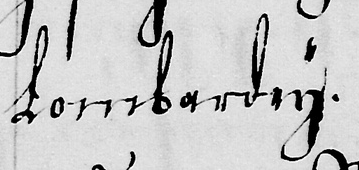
Lombardey.
